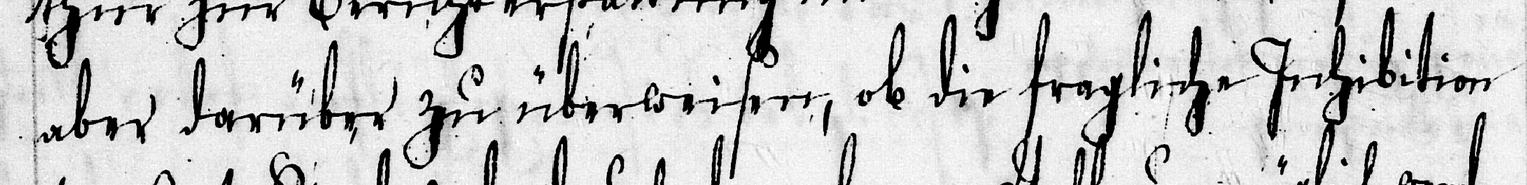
aber darüber zu überweisen, ob die fraglich Inhibition
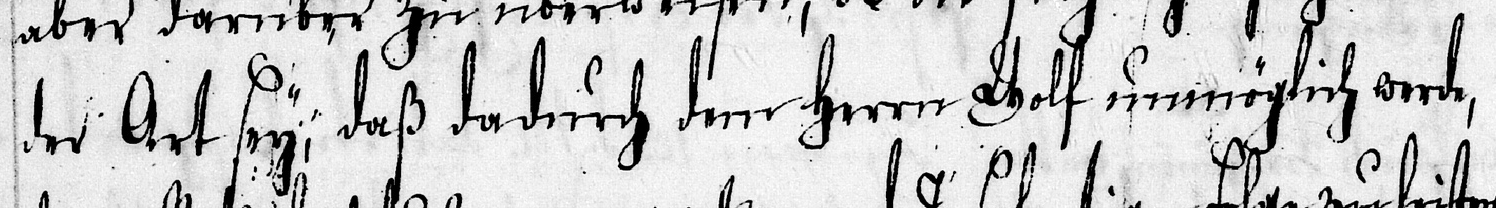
der Art sey, daß dadurch dem Herrn Wolf unmöglich werd¬
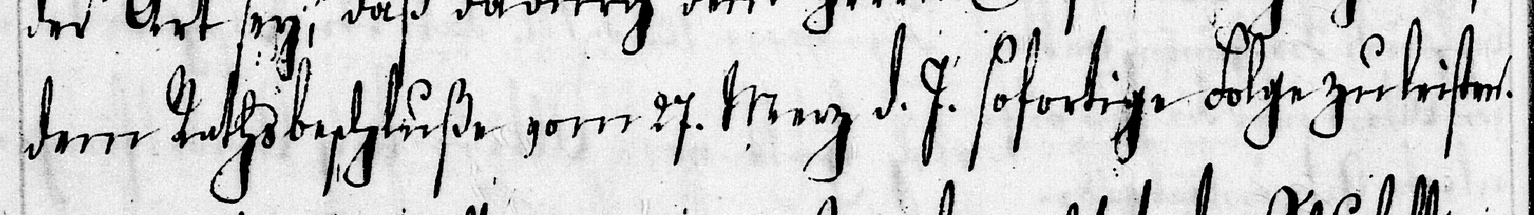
dem Rathsbeschluße vom 27. Merz d. J. sofortige Folge zu leiste¬
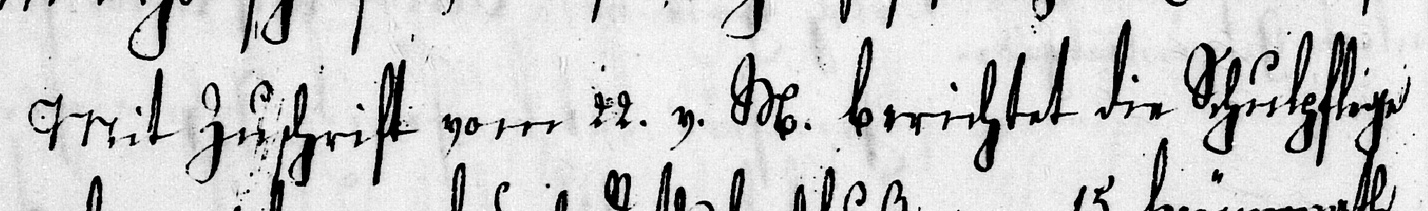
Mit Zuschrift vom 22. v. M. berichtet die Schulpflege
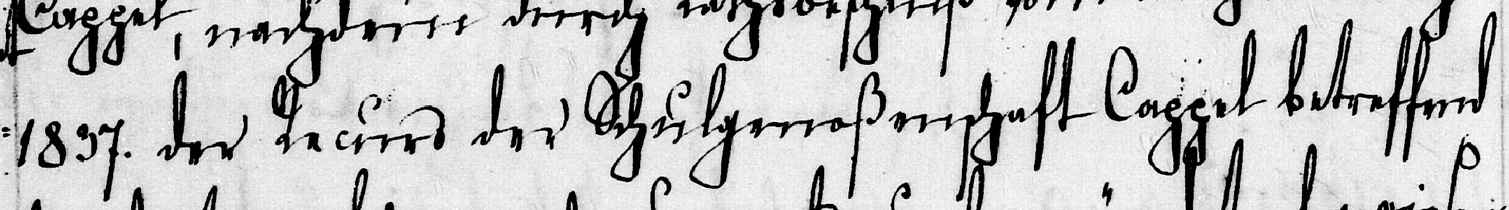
1837. der Recurs der Schulgenoßenschaft Cappel betreffe¬
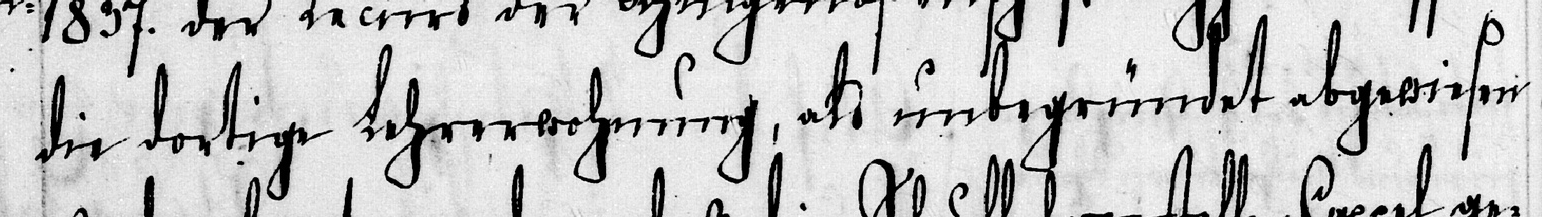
die dortige Lehrerwohnung, als unbegründet abgewiesen
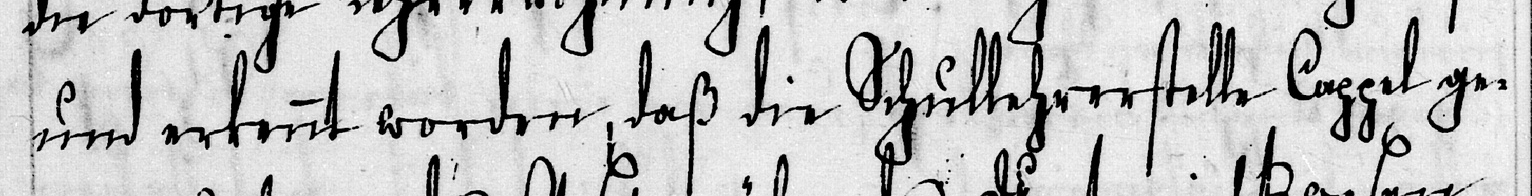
und erkennt worden, daß die Schullehrerstelle Cappel
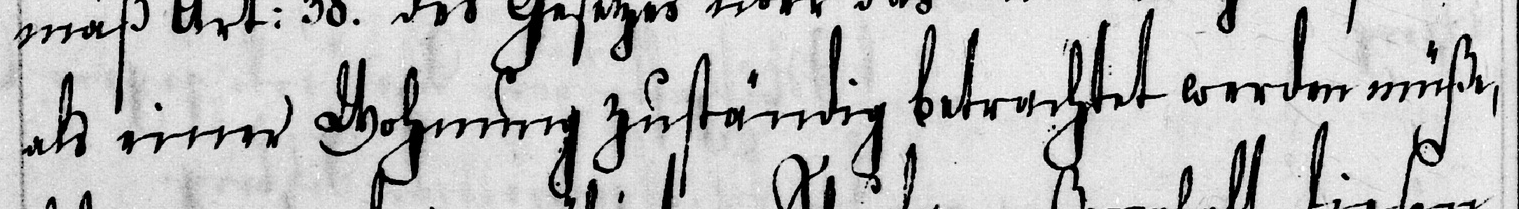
als einer Wohnung zuständig betrachtet werden müße,
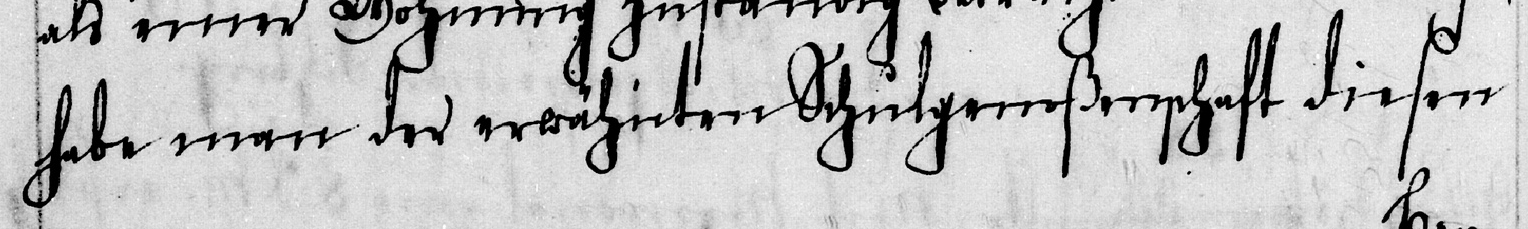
habe man der erwähnten Schulgenoßenschaft diesen
